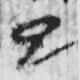巳
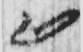㠯（以）
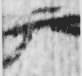亓（其）
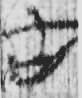古（故）
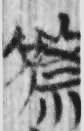○（敓）
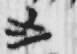之
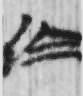於
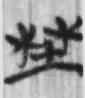埜（野）
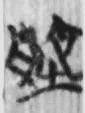○（地）
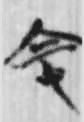○（主）
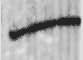一
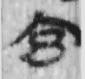宮
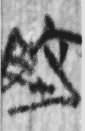○（地）
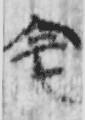○（主）
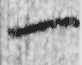一
